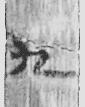九
